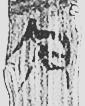今
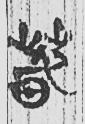萅
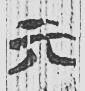亓
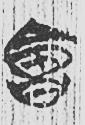會
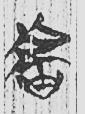者
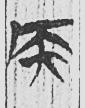侯
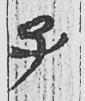子
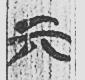亓
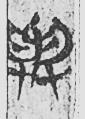與
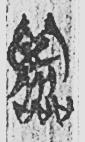臨
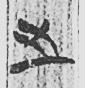之
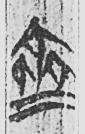齊
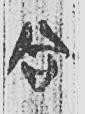冋
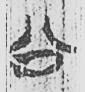公
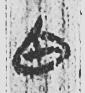囟
